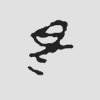是
